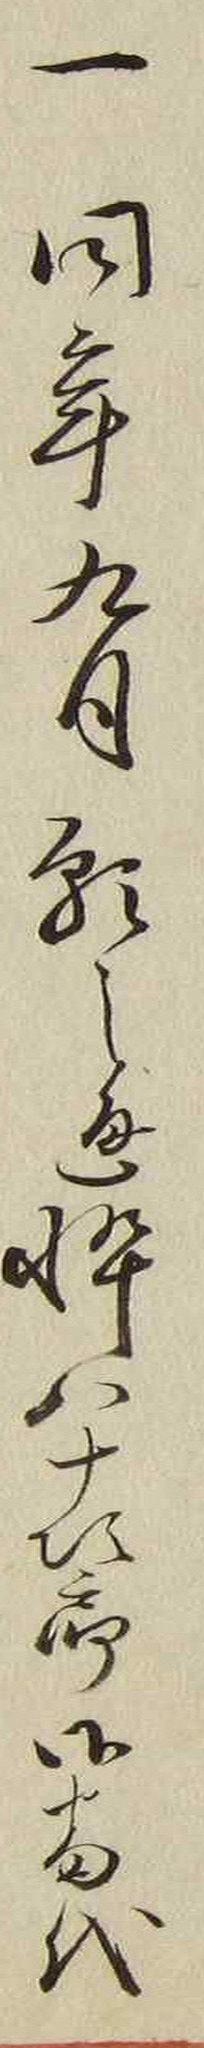一同年九月願い之通り倅八十次郎御番代

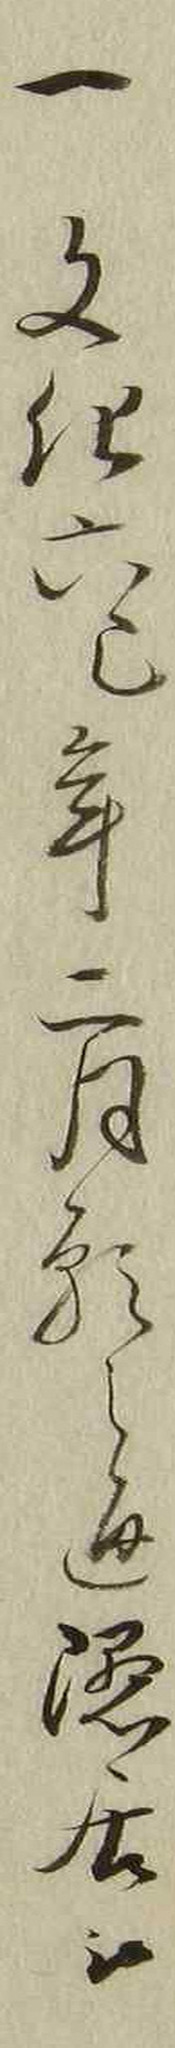一文化六巳年二月願い之通り隠居
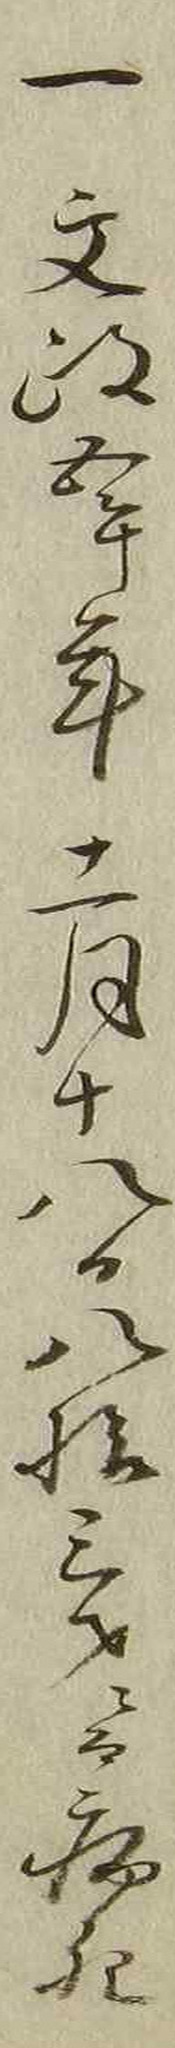一文政五午年十一月十八日八拾三才ニて病死
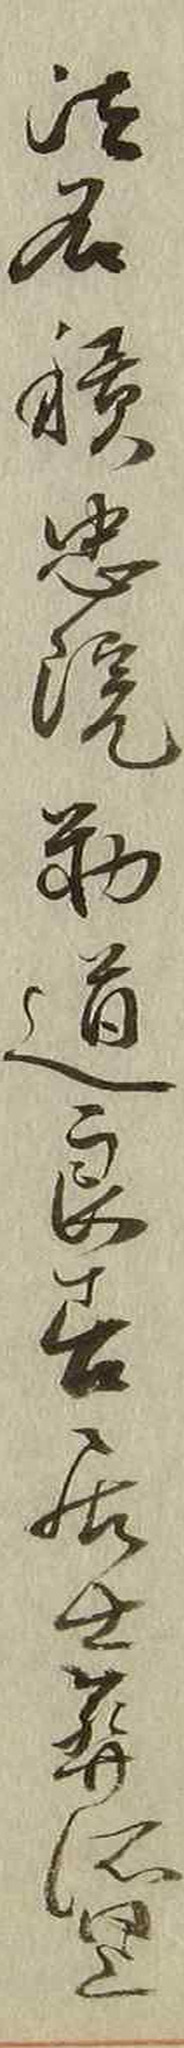法名積忠院勤道良善居士葬所同上
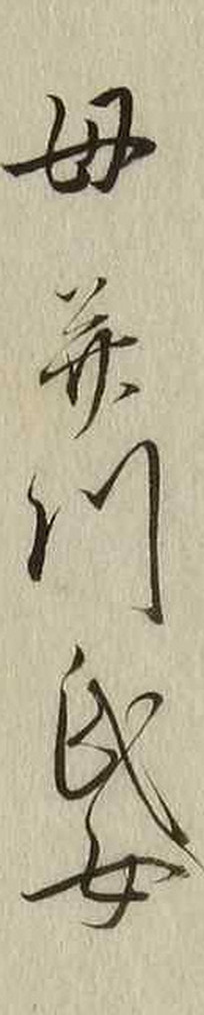母并川氏女
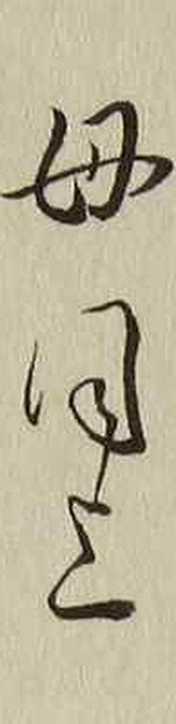母同上
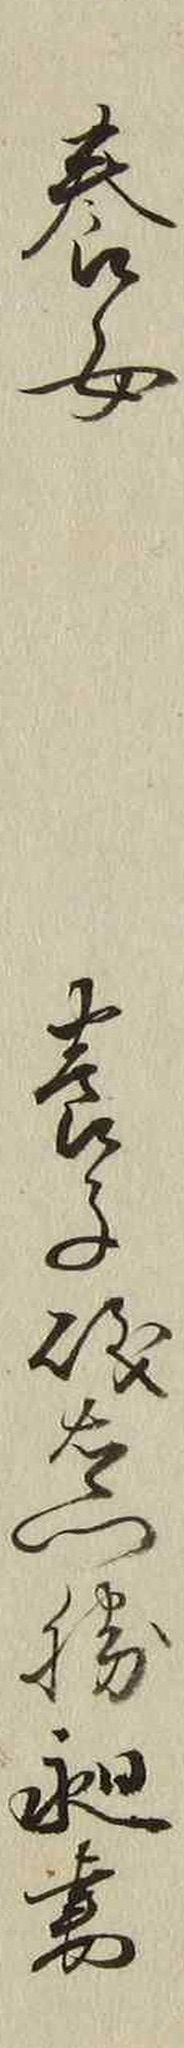養女養子磯右衛門勝昶妻
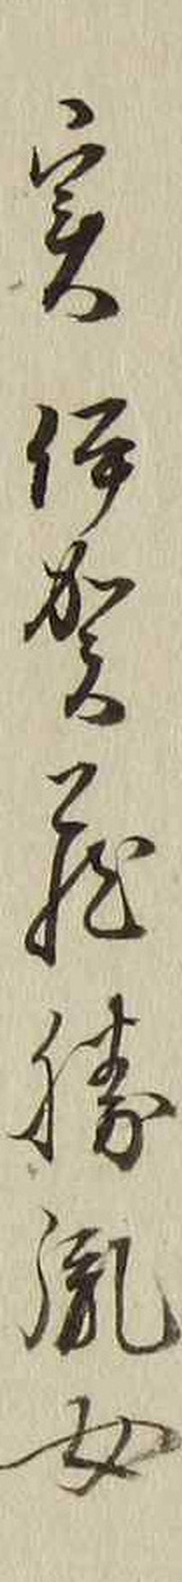実伊賀蔵勝胤女

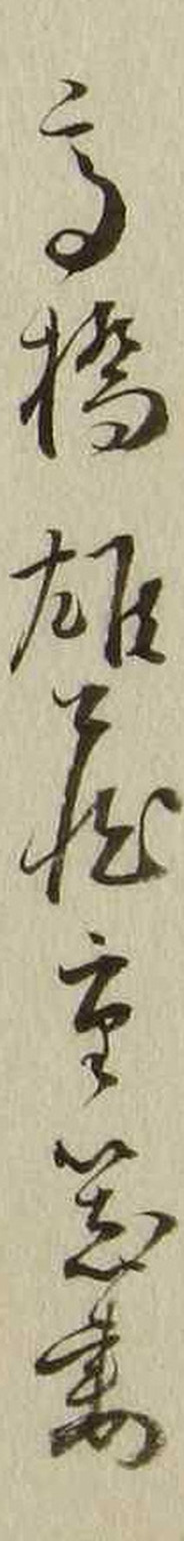女高橋雄蔵重器妻
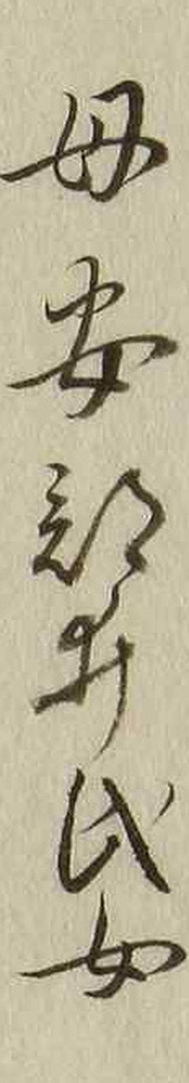母安部井氏女
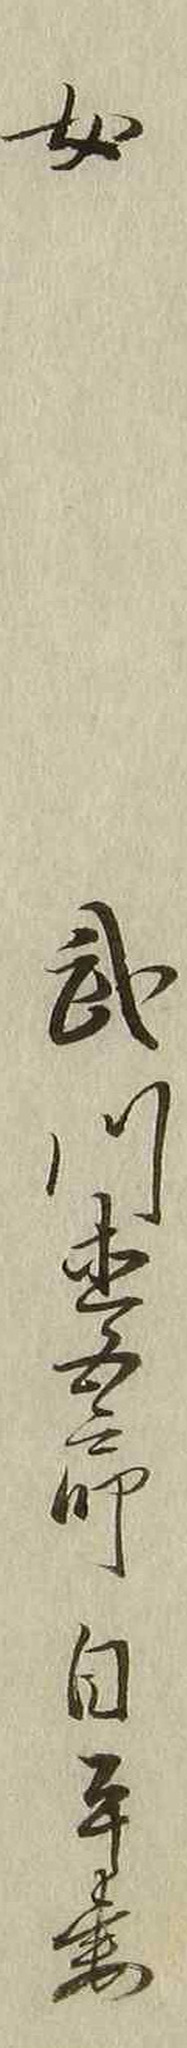女武川直五郎自平妻
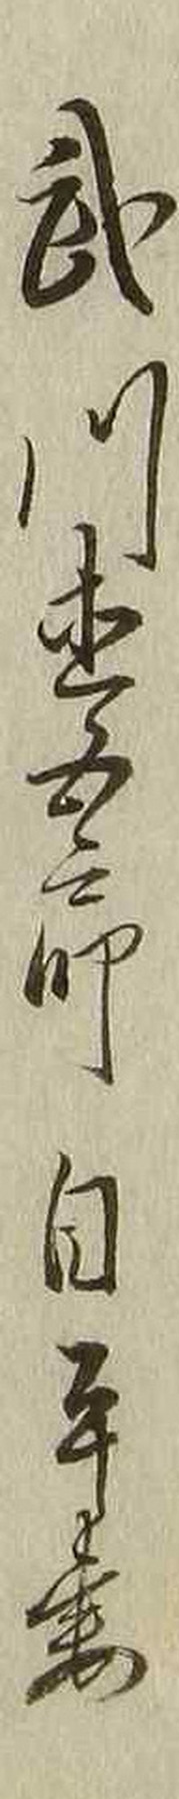女武川直五郎自平妻
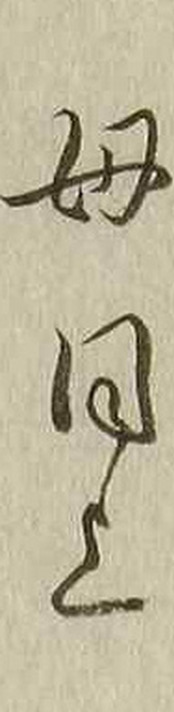母同上
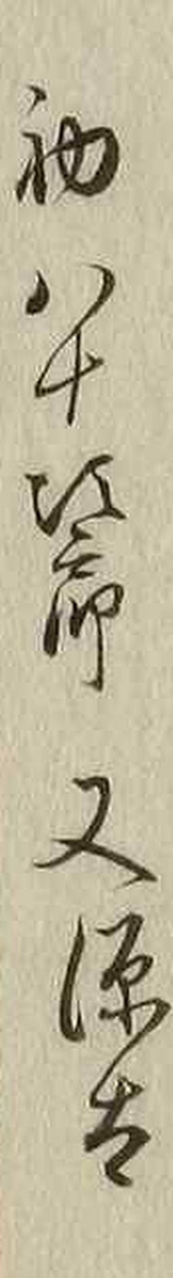初八十次郎源太
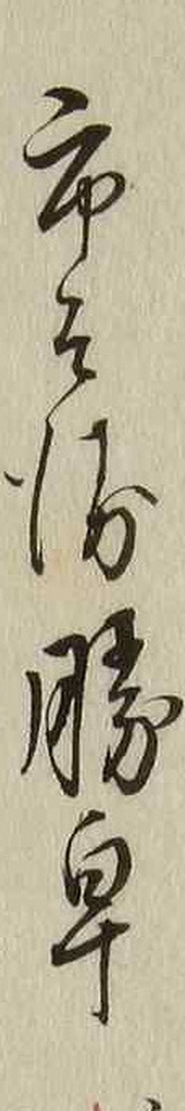市兵衛勝卑
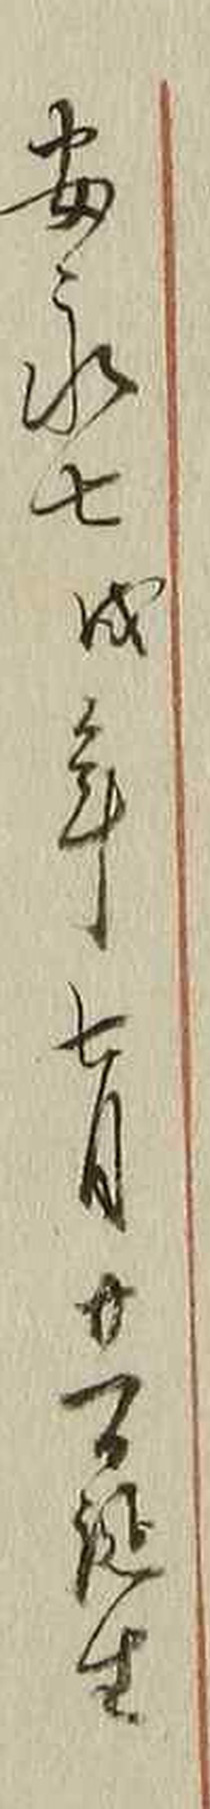安永七戌年七月廿一日誕生
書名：諸士系譜　巻之20　い之部20
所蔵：会津若松市立会津図書館
